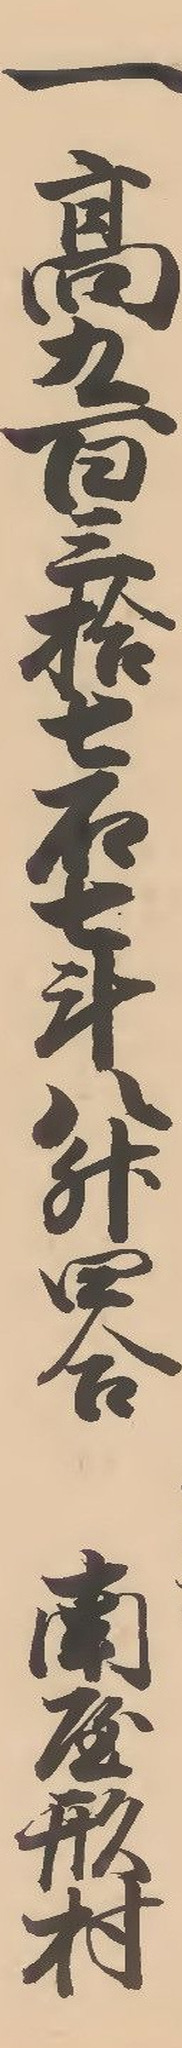一高九百三拾七石七斗八升四合南屋形村

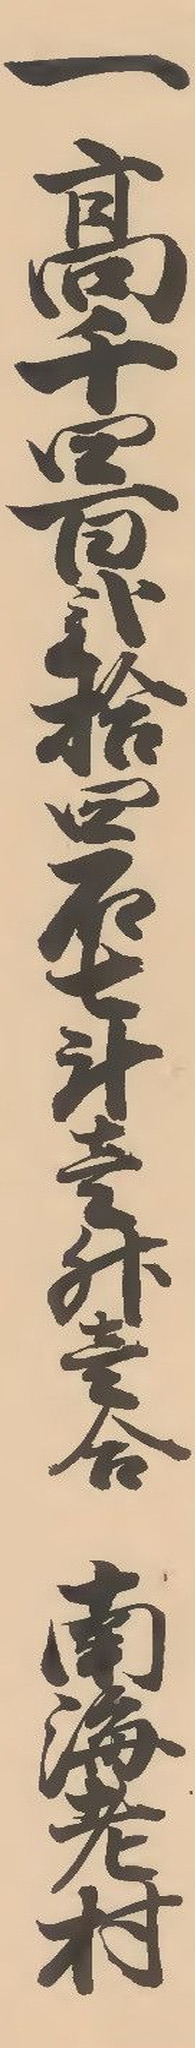一高千四百弐拾四石七斗壱升壱合南海老村
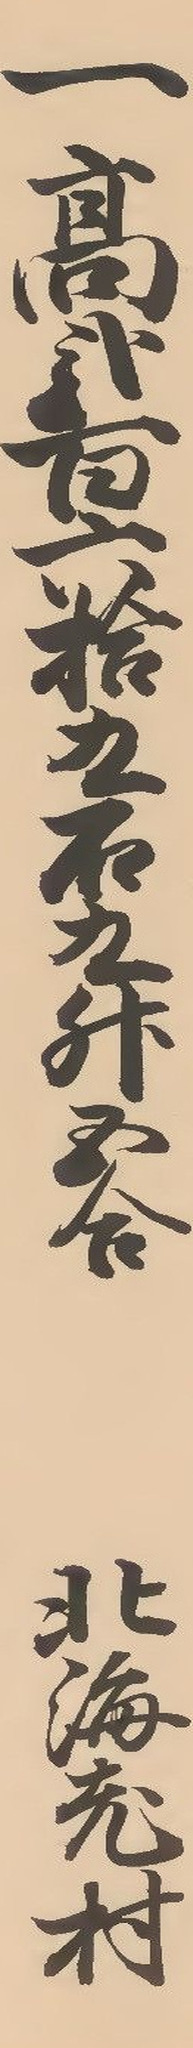一高弐百六拾九石九升五合北海老村
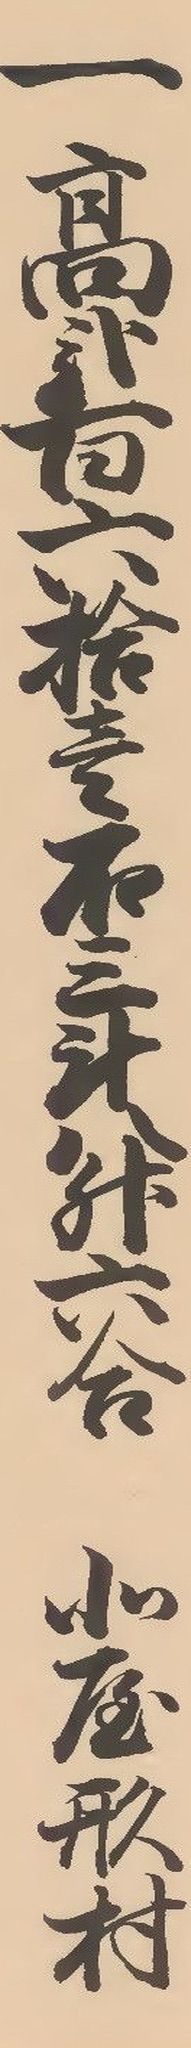一高弐百六拾壱石三斗八升六合北屋形村
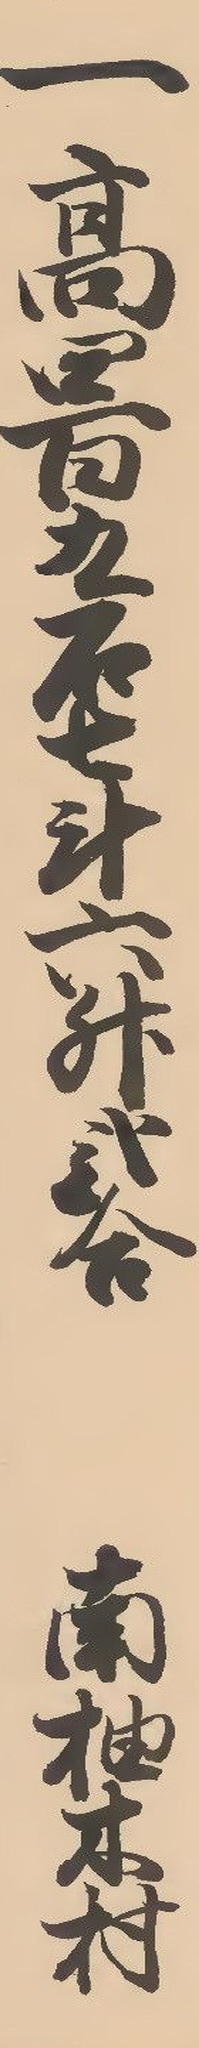一高四百九石七斗六升弐合南柚木村
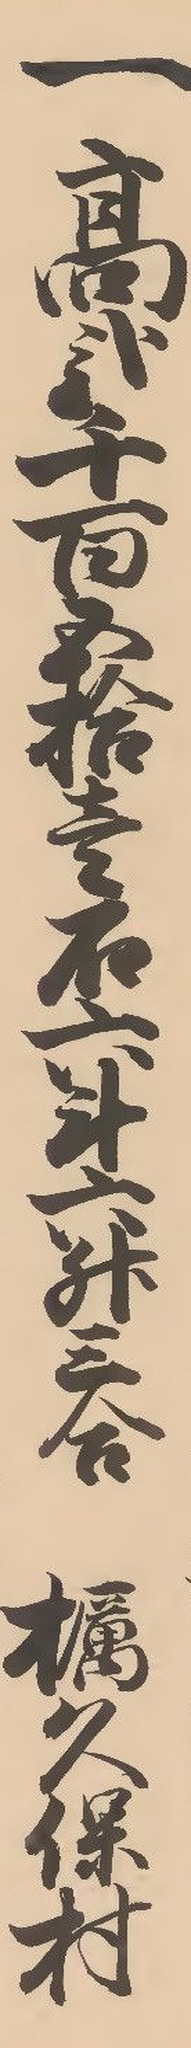一高弐千百五拾壱石六斗六升三合栃久保村
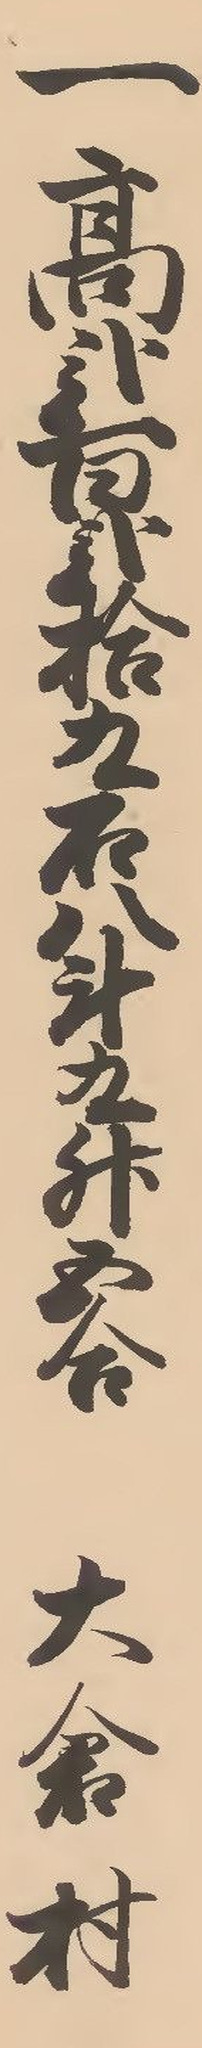一高弐百弐拾九石八斗九升五合大倉村
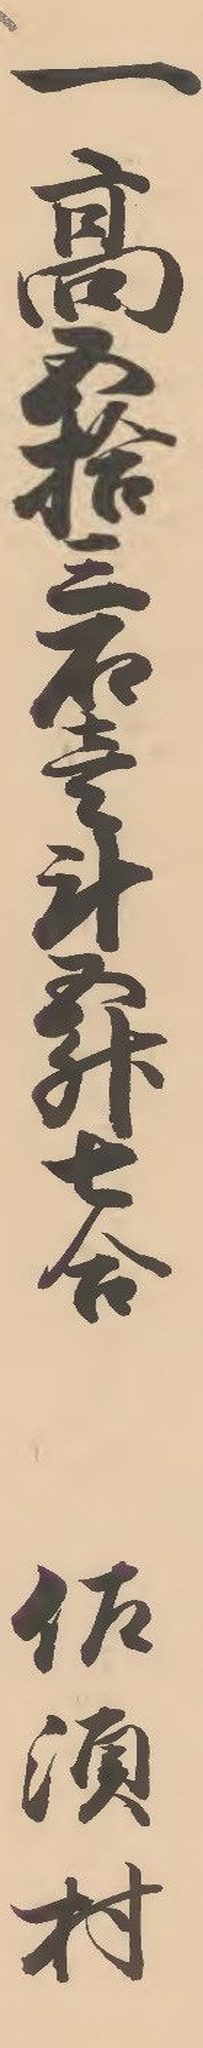一高五拾三石壱斗五升七合佐須村

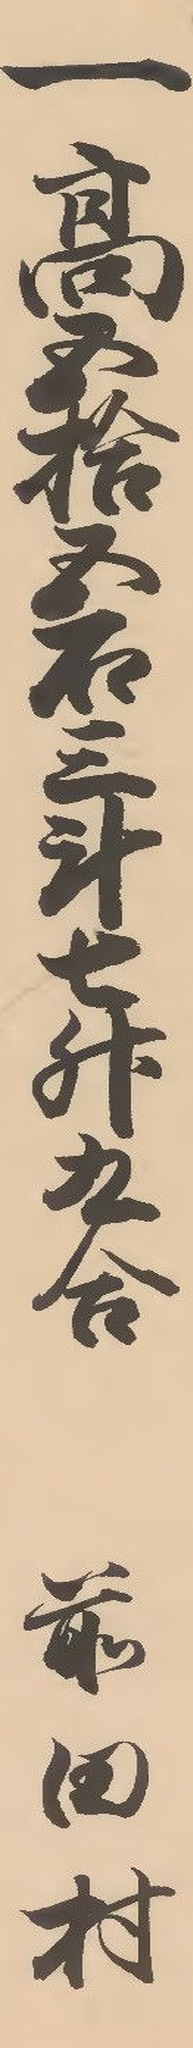一高五拾五石三斗七升九合前田村
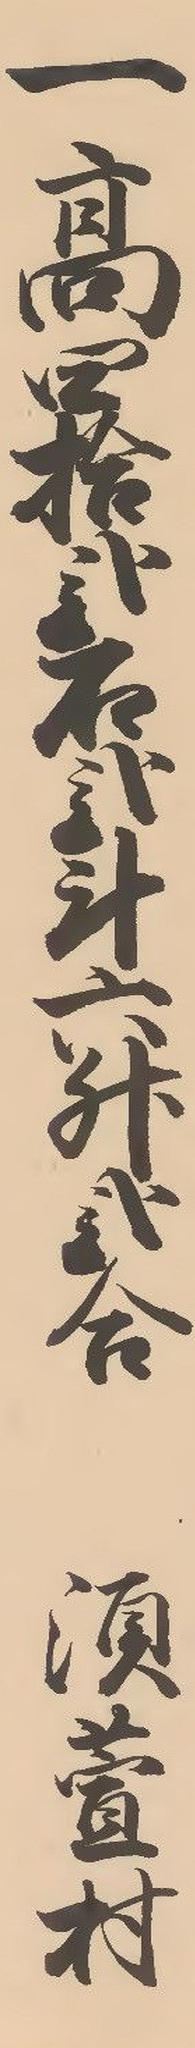一高四拾弐石弐斗六升弐合須萱村
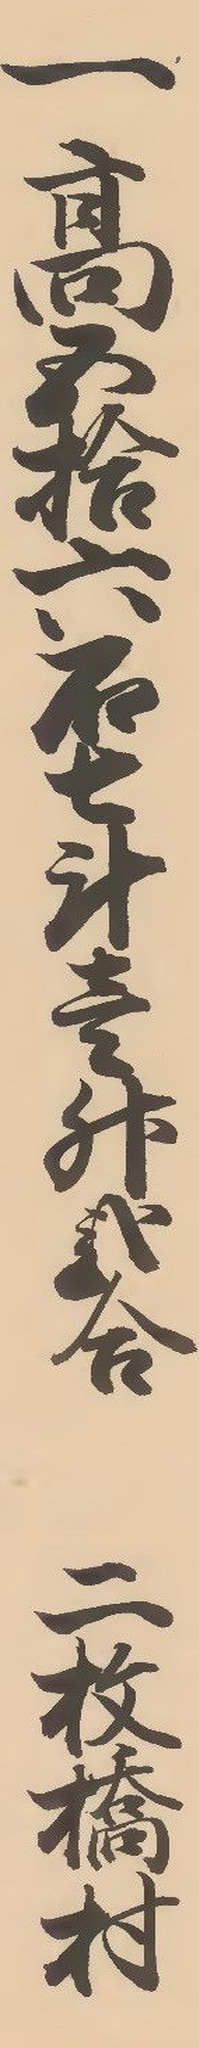一高五拾六石七斗壱升弐合二枚橋村
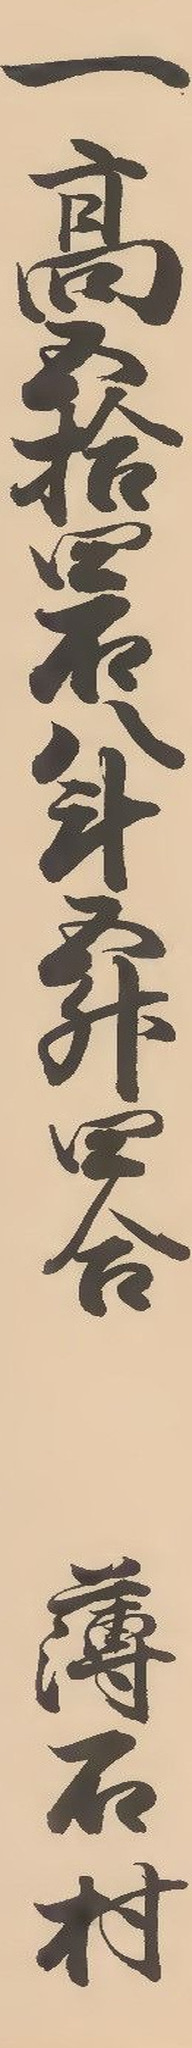一高五拾四石八斗五升四合薄石村
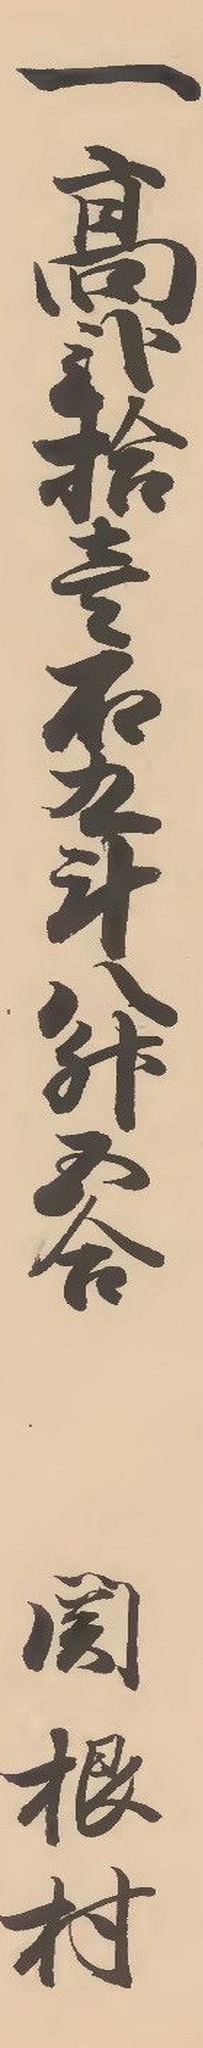一高弐拾壱石九斗八升五合関根村
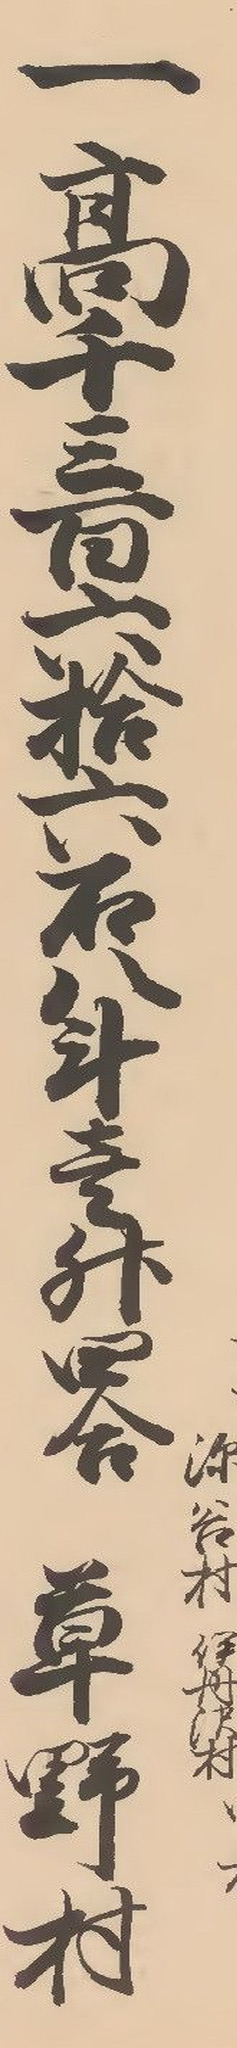一高千三百六拾六石八斗壱升四合草野村
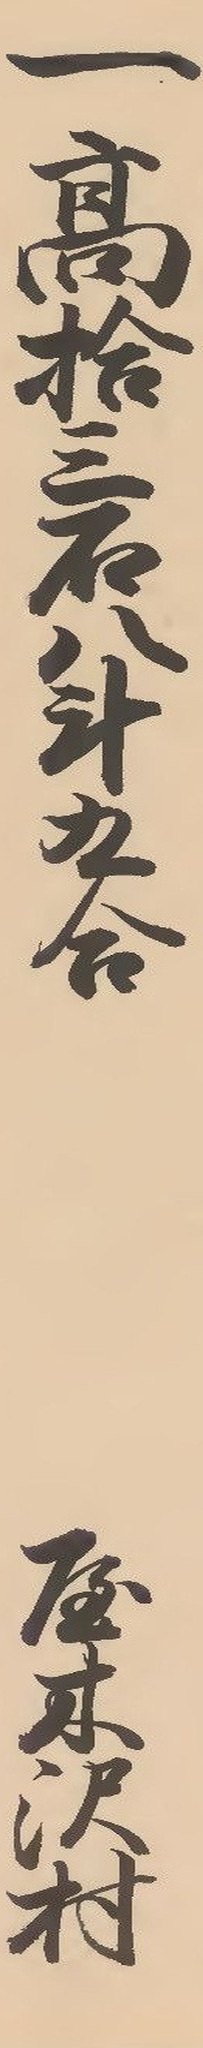一高拾三石八斗九合屋木沢村
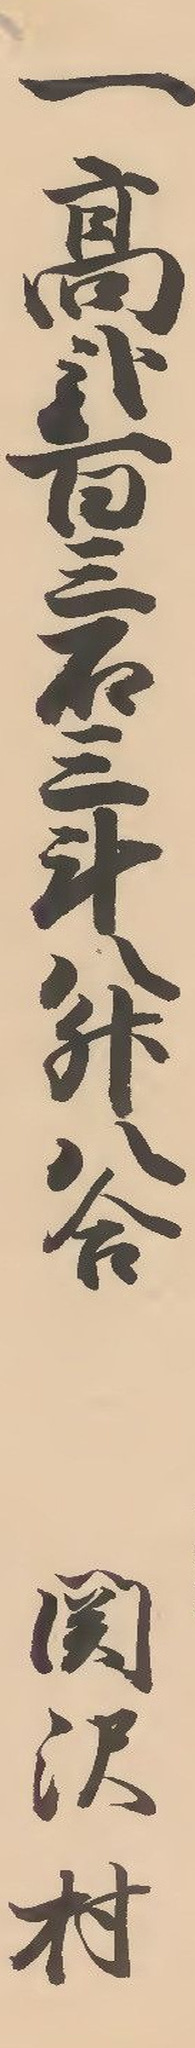一高弐百三石三斗八升八合関沢村
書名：陸奥国郷帳　３
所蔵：国立公文書館 National Archives of Japan
